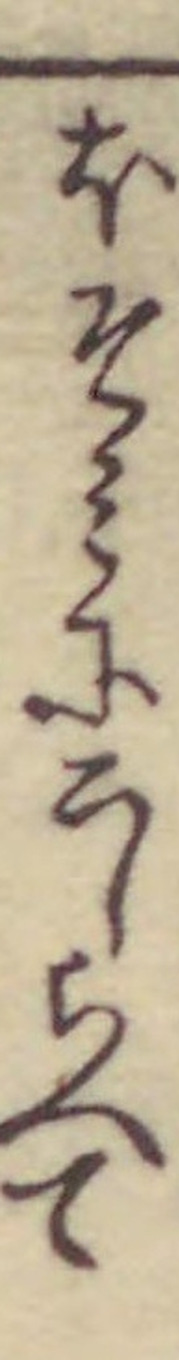ほそみにこしらへて
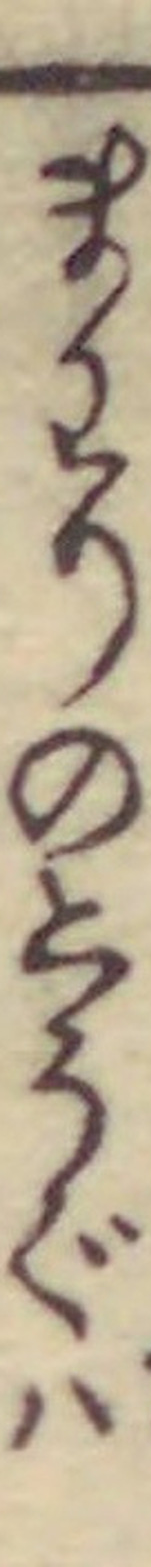まわりのとうぐは
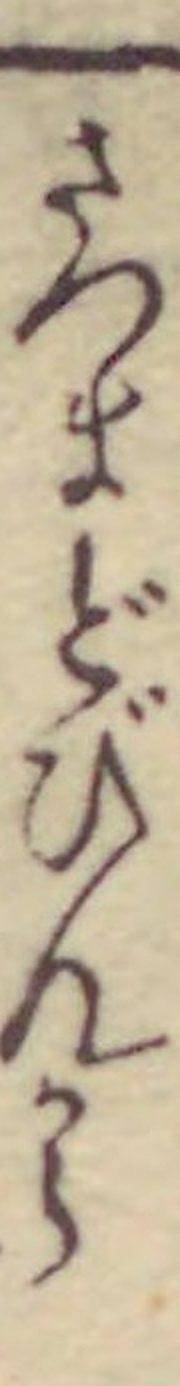さつまどびんから
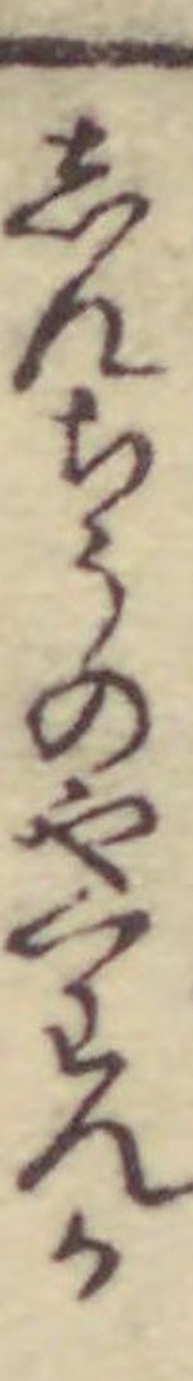しんちうのやくわんか
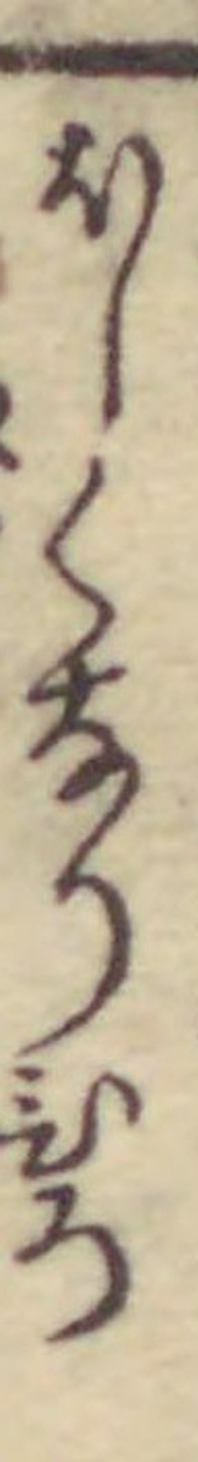ほしくなりひろ
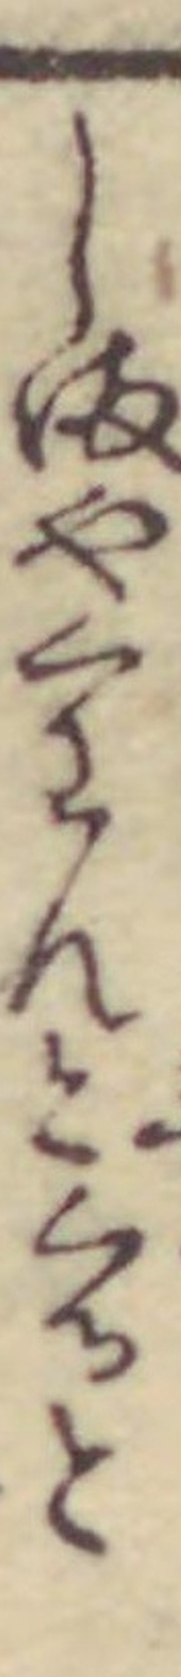しまやくわんとくると
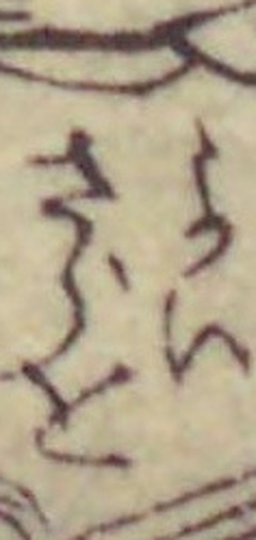さらを
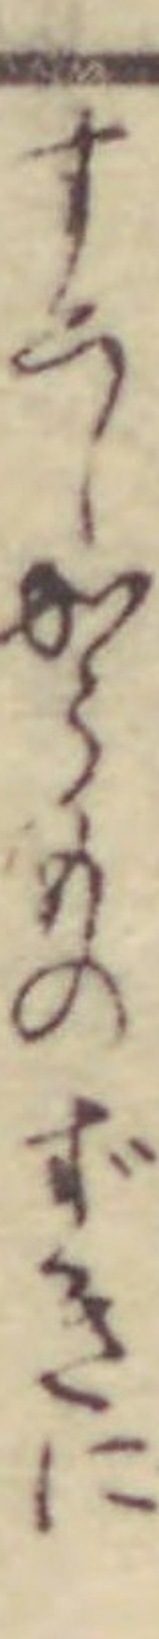すこしからものずきに
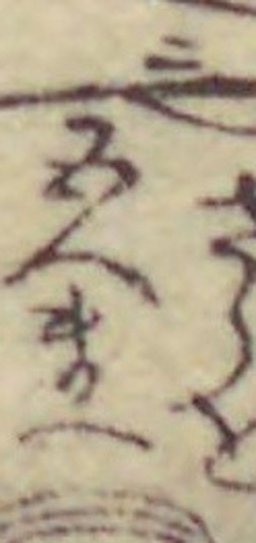五人まへ
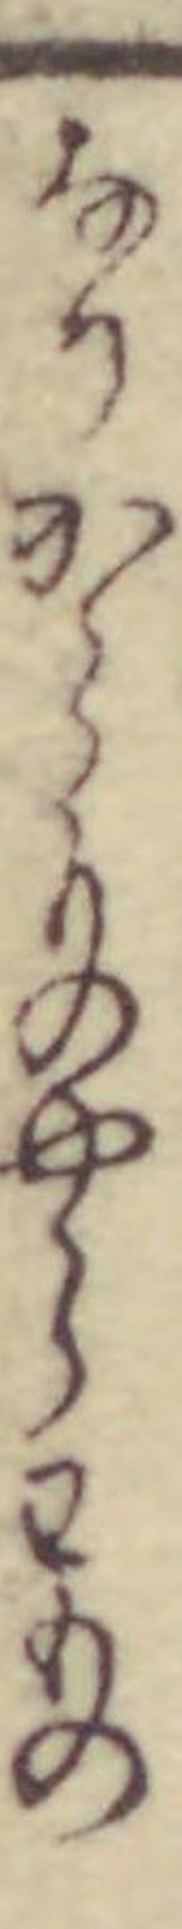なりからものやらわもの
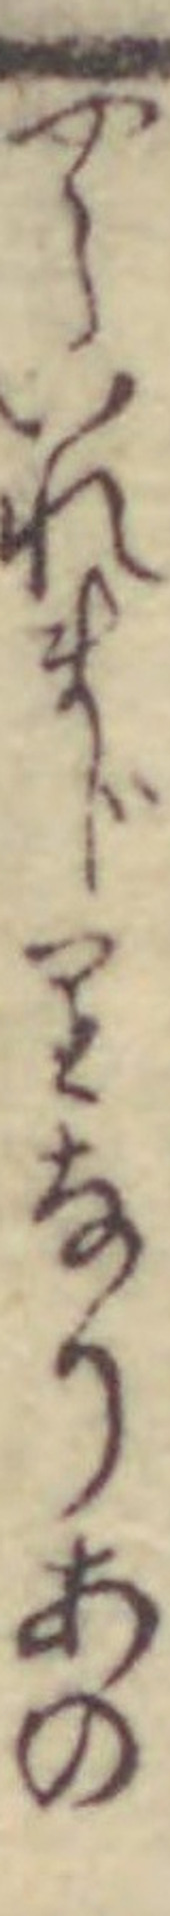やらいれまじりとなりあの
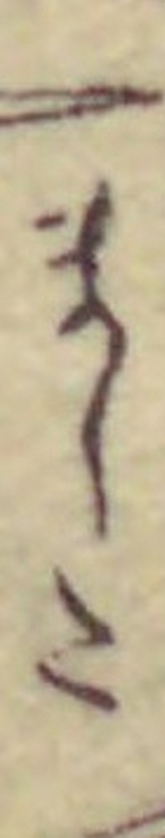ました
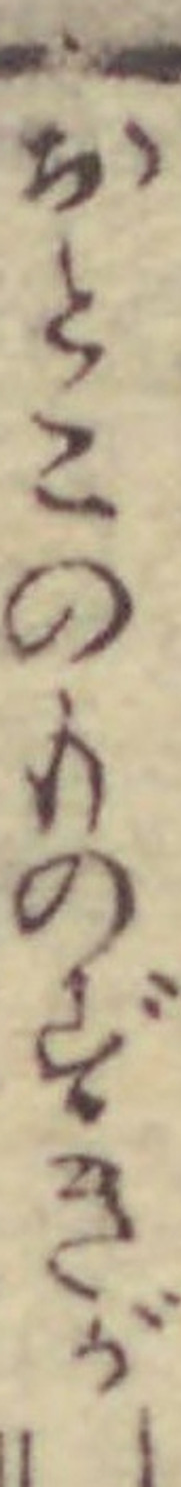おとこのものずきが
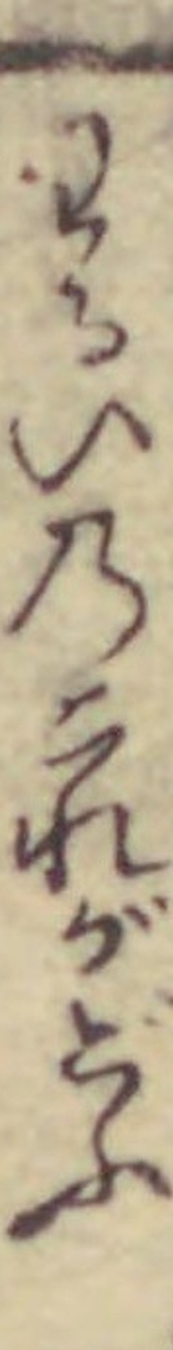わるいのこれがどふ
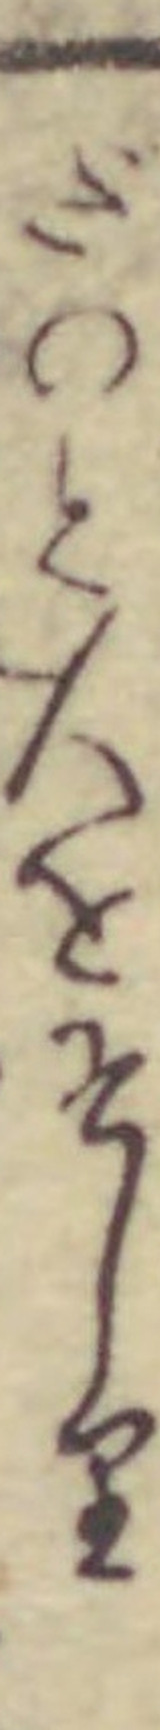だのと人をそしり
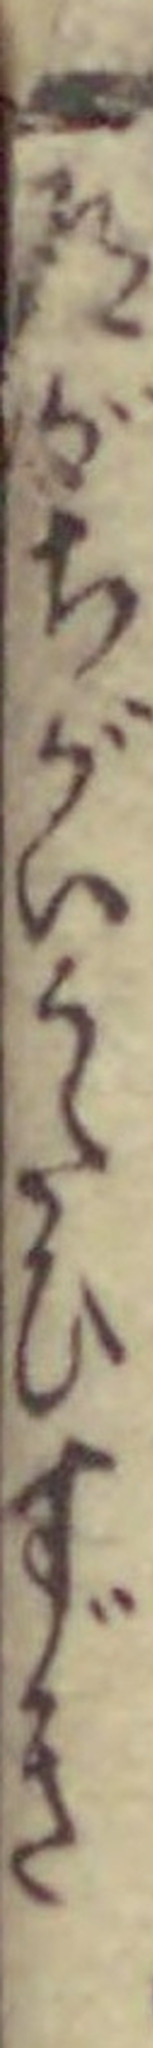道がちがいうたひずき
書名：大通人穴[サガシ] 3巻
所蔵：国立国会図書館 National Diet Library, JAPAN
